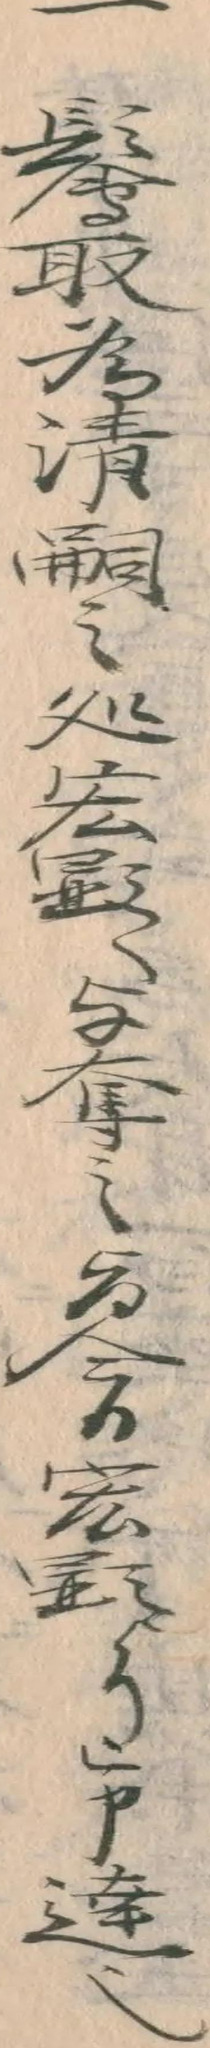一髪取為清嗣之処宏顕へ与奪之旨今日宏顕より被申達也
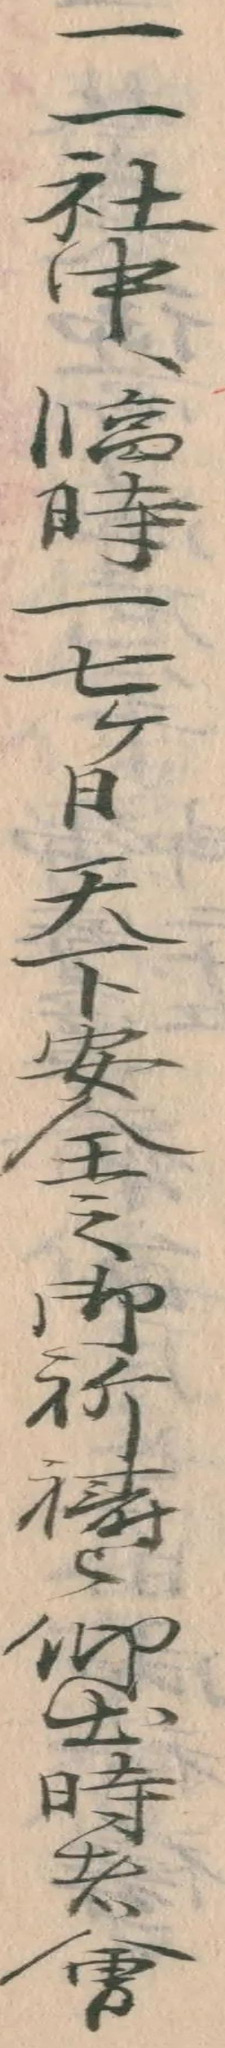一一社中へ臨時一七ヶ日天下安全之御祈祷被仰出時者會
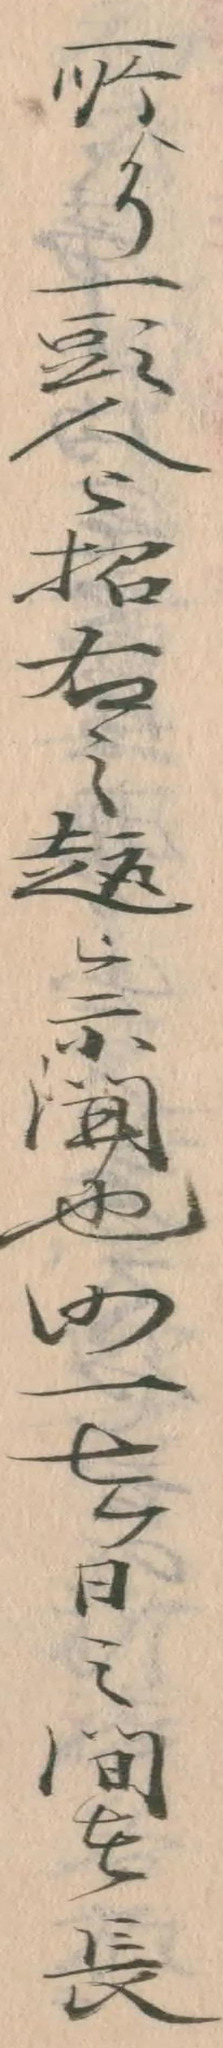所より一頭人被招右之趣被示聞也仍一七ケ日之間其長
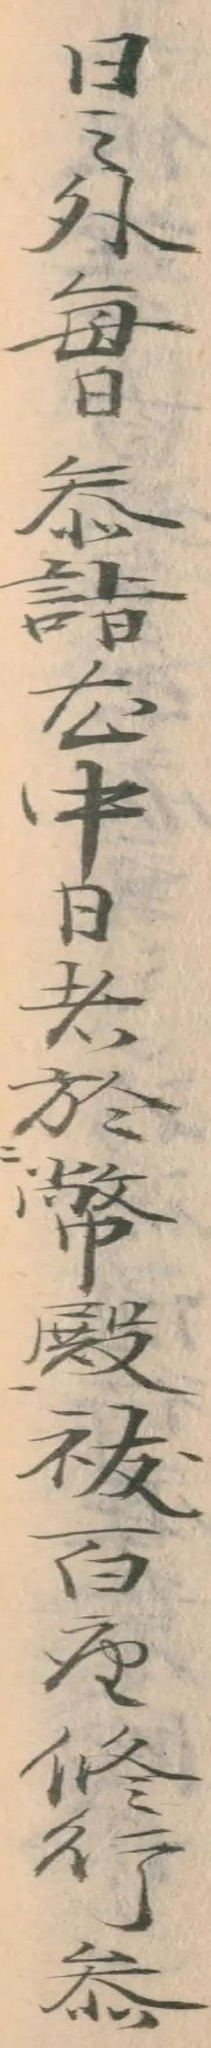日之外毎日参詣尤中日者於幣殿祓百座修行参
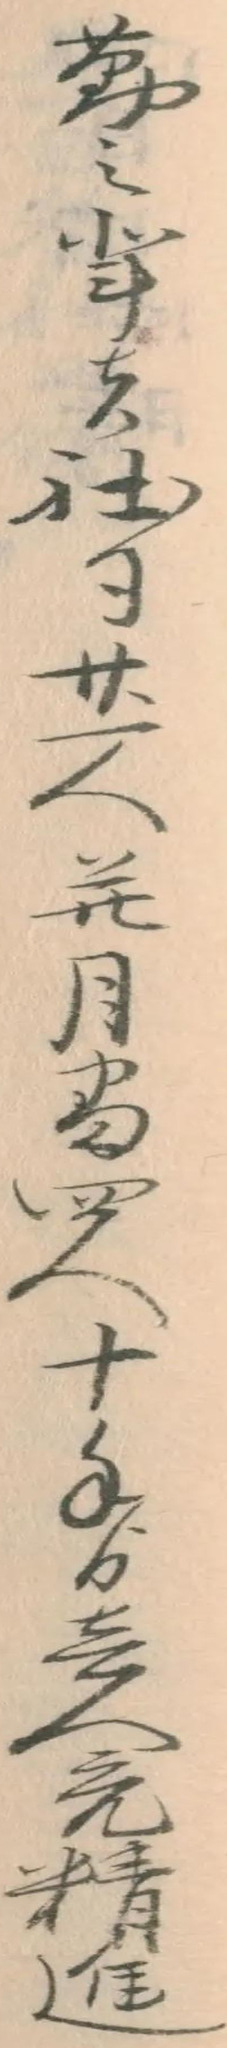勤之輩は社司廿一人并月番四人十手ゟ壱人充精進
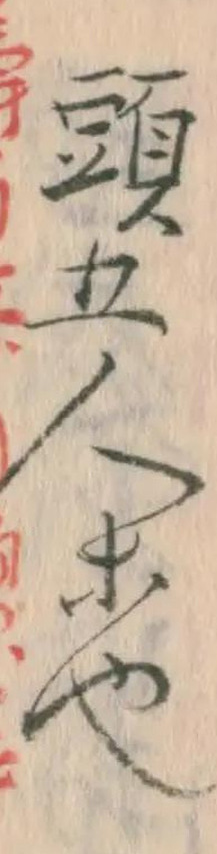頭五人等也
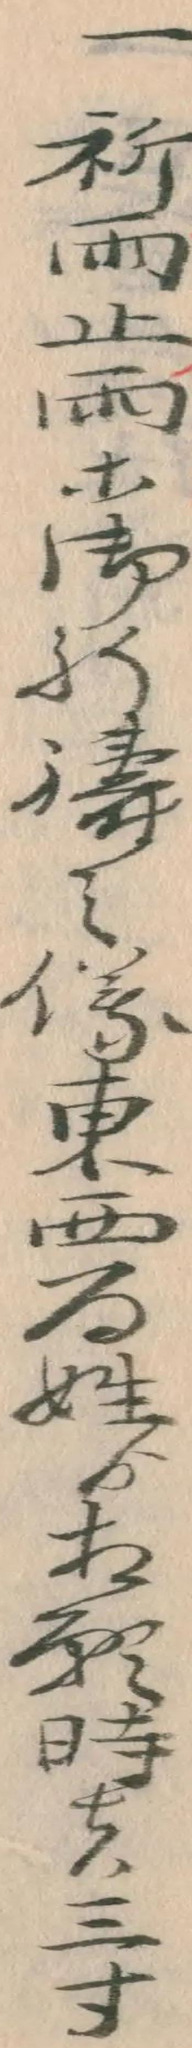一祈雨止雨等御祈祷之儀東西百姓ゟ相願時は三寸
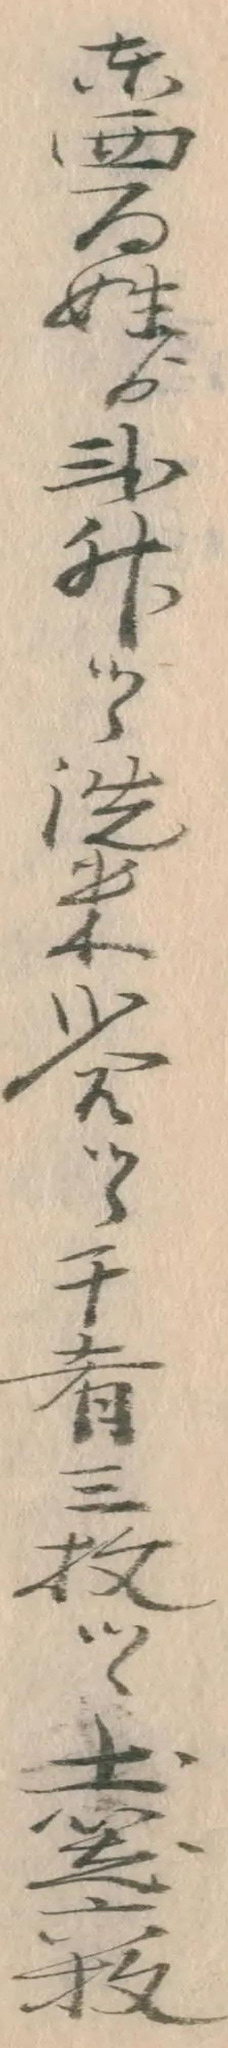東西百姓ゟ弐升ツヽ洗米弐合ツヽ干肴三枚ツヽ土器六枚
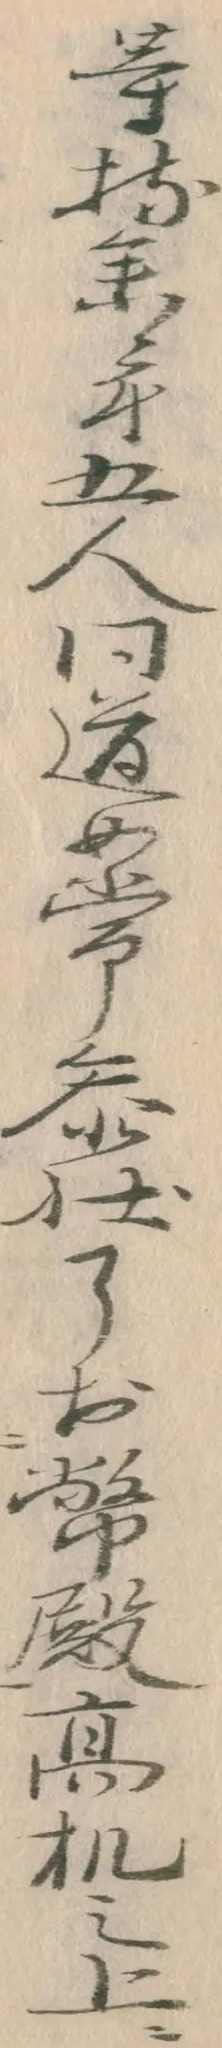等持参ニ付五人同道如常参社了出幣殿高机之上ニ
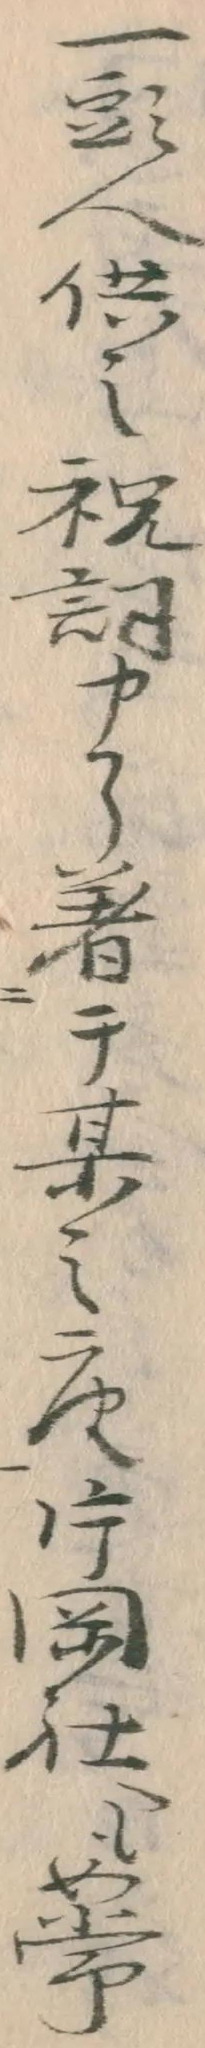一頭人供之祝詞申了着于某之座片岡社へも如常
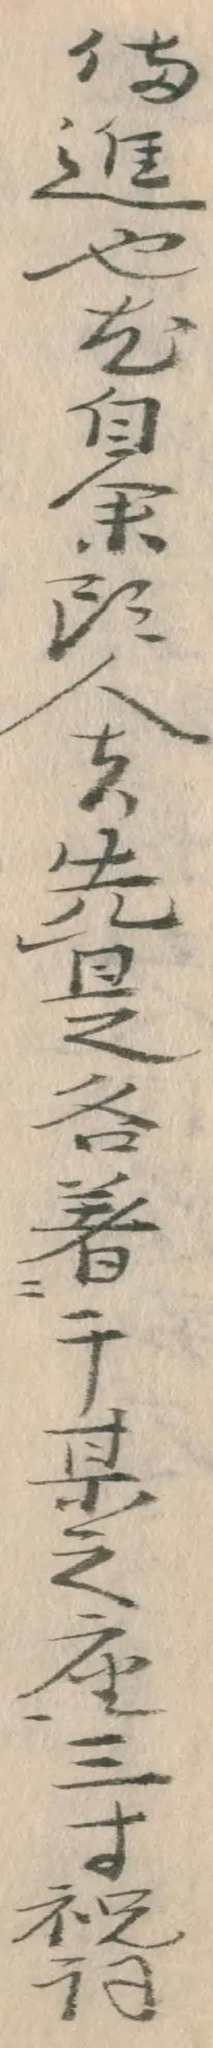備進也尤自余頭人者先是各着于某之座三寸祝詞
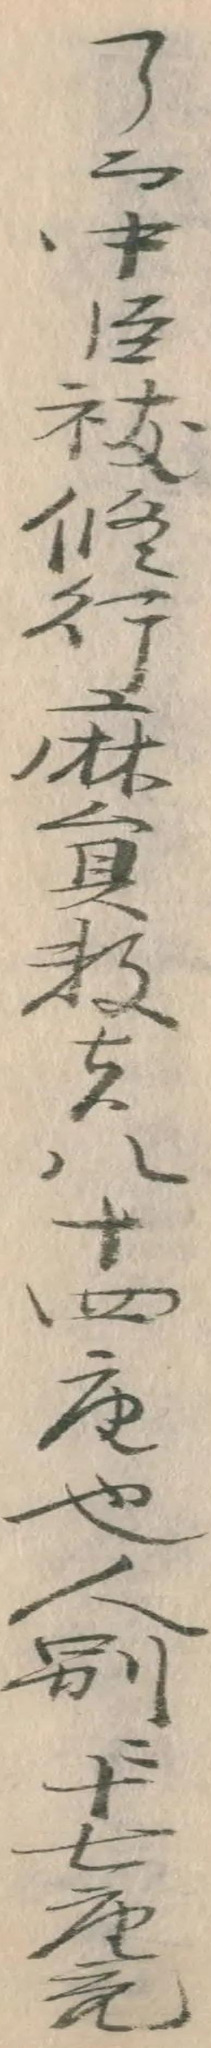了而中臣被修行麻員数は八十四座也人別ニ十七座充
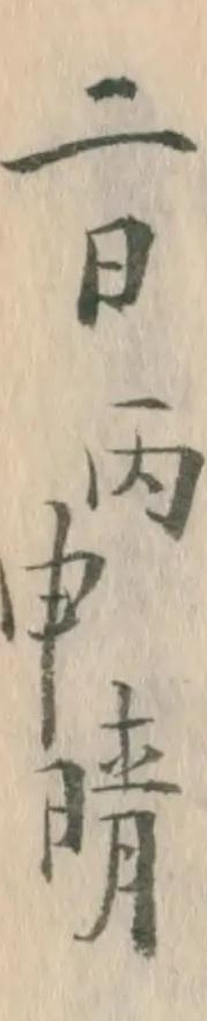二日丙申晴

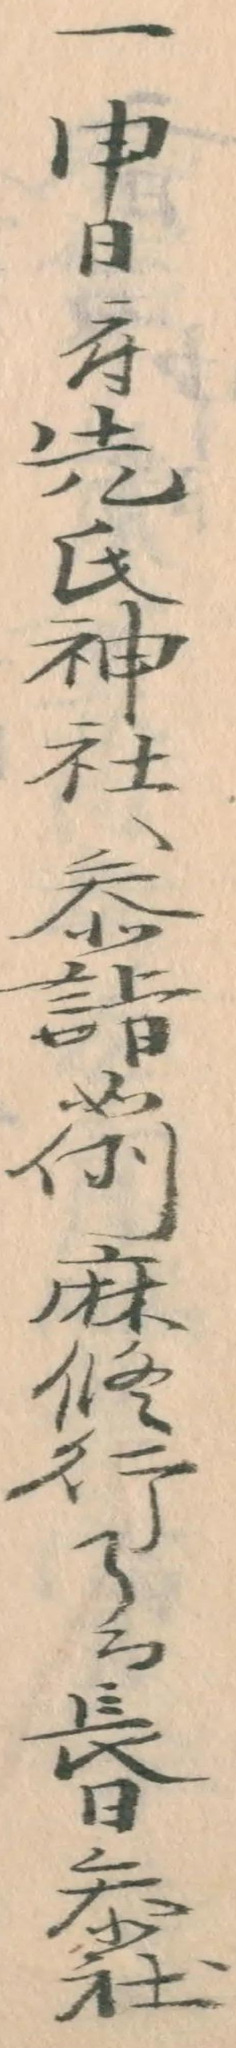一申日ニ付先氏神社へ参詣如例麻修行了而長日参社
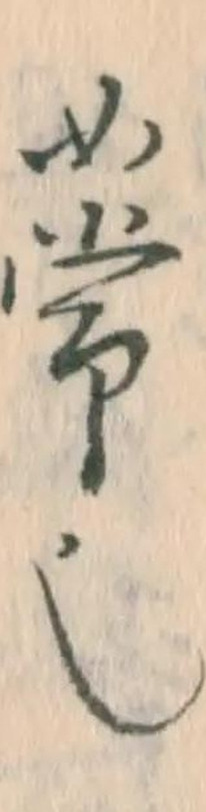如常也
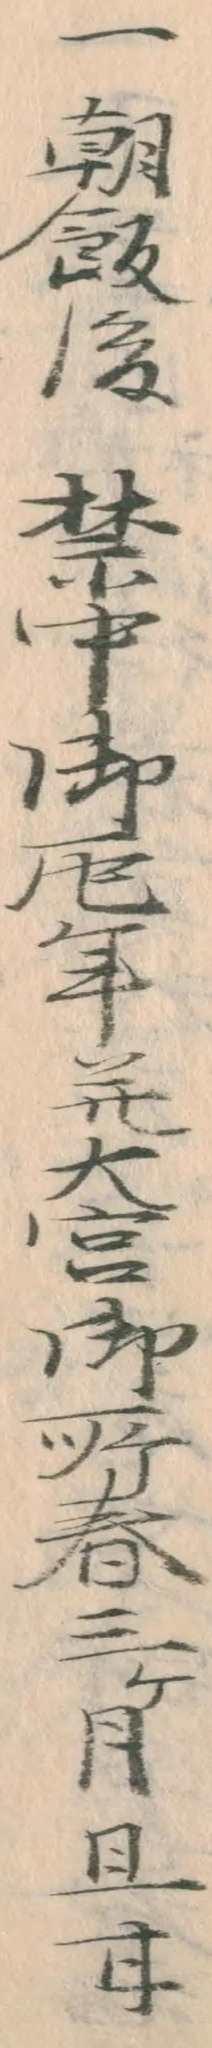一朝飯後禁中御厄年并大宮御所春三ケ月且甘
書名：賀茂社記録. 第72冊
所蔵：国立国会図書館 National Diet Library, JAPAN
